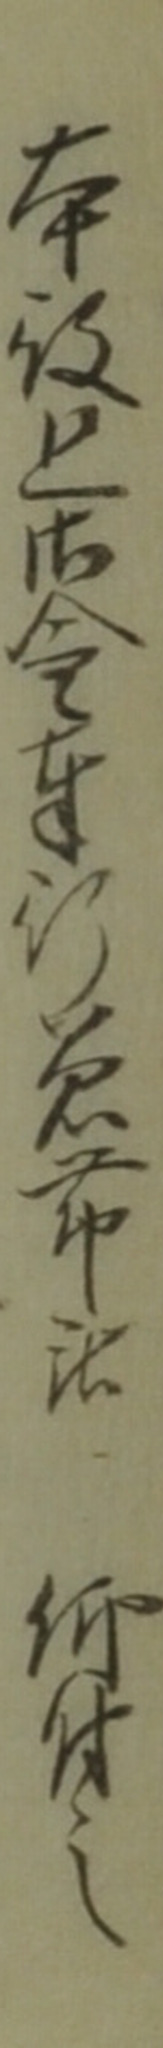本役且御金奉行兼帯被仰付之
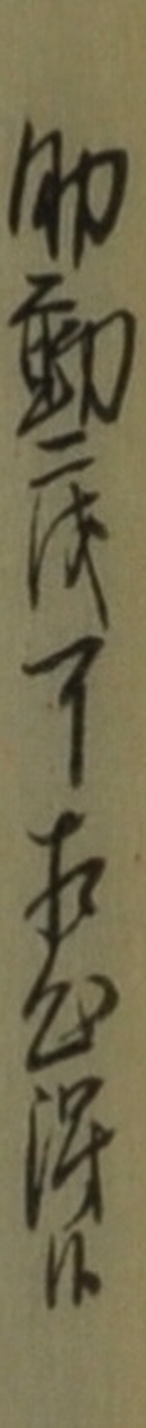助勤茂可相心得候
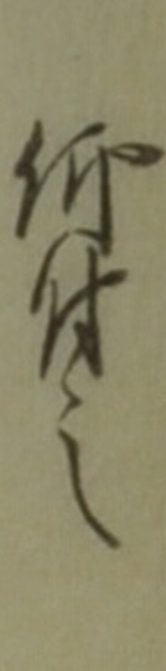仰付之
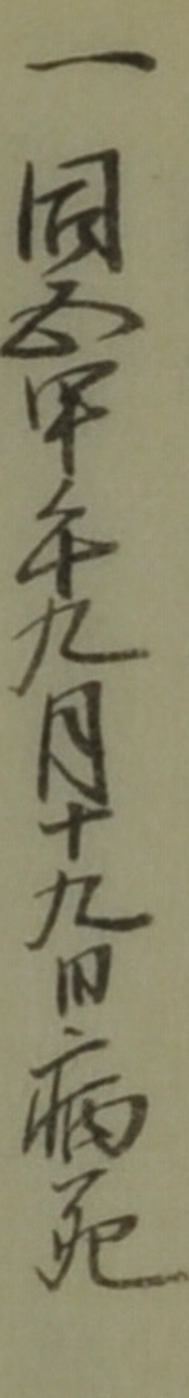一同五甲午九月十九日病死
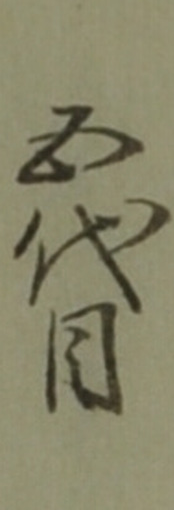五代目
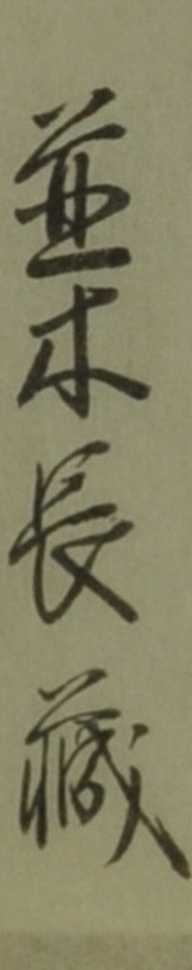並木長蔵
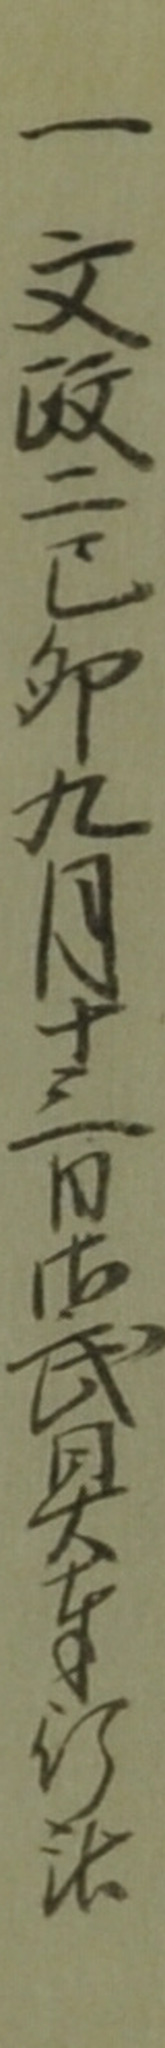一文政二己卯九月十三日御武具奉行被
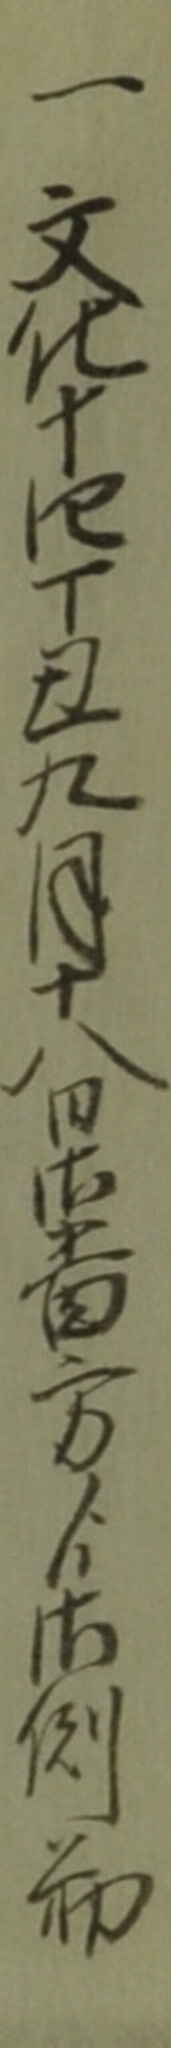一文化十四丁丑九月十八日御番方ゟ御側勤
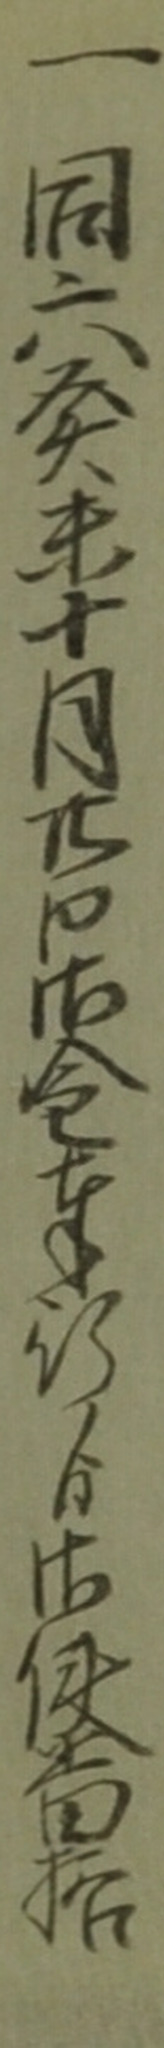一同六癸未十月廿日御金奉行ゟ御使番格
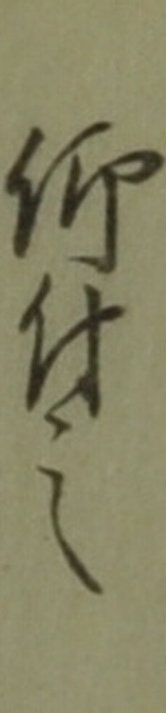仰付之
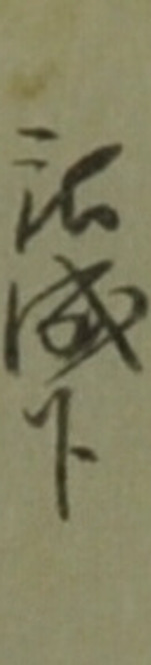被成下
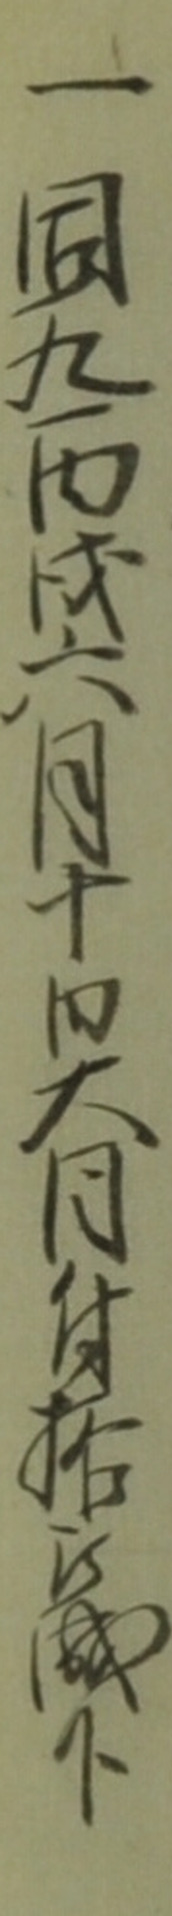一同九丙戌六月十日大目付格被成下
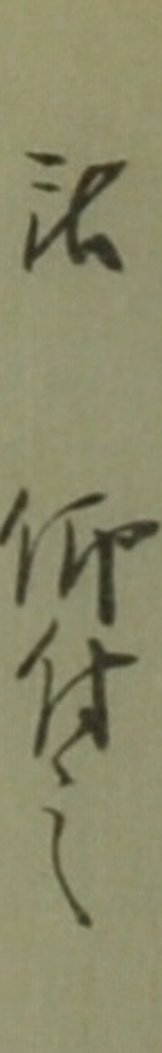被仰付之
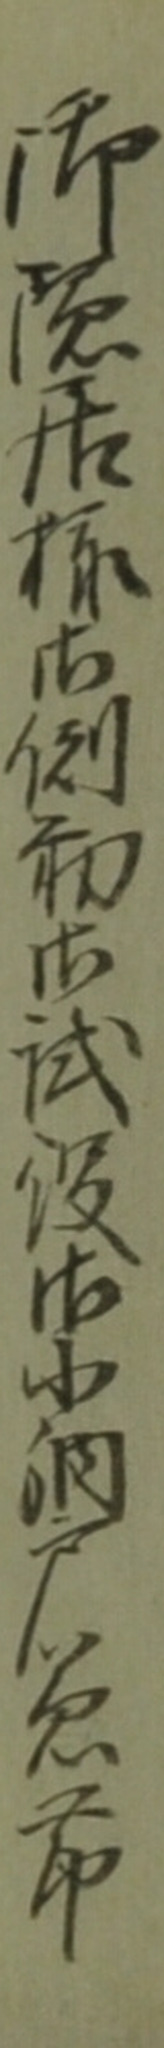御隠居様御側勤御試役御小納戸兼帯
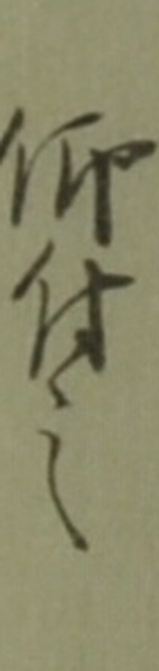仰付之

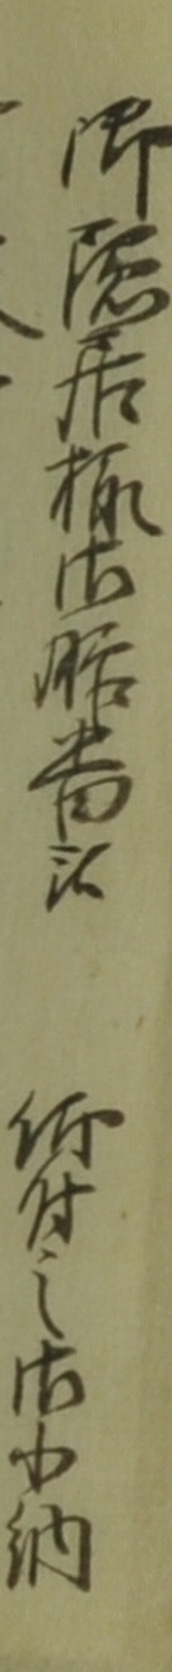御隠居様御膳番被仰付之御小納
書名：諸御役代々録（五）
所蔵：伊那市立高遠町図書館・合同会社AMANE
